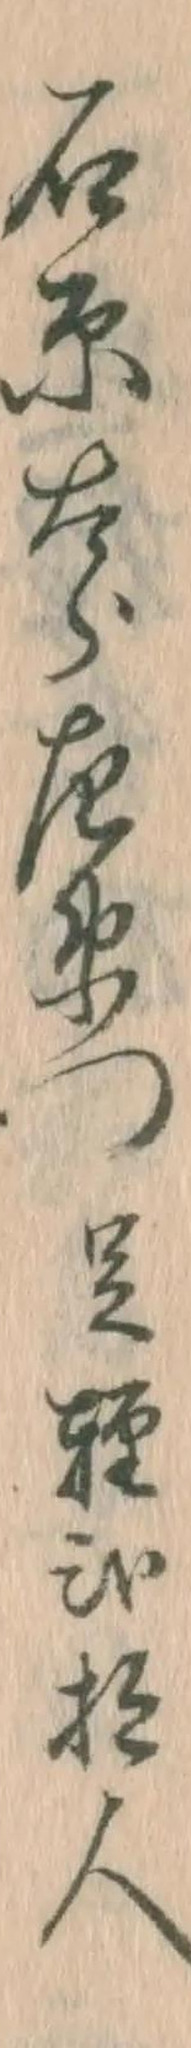石原太郎左衛門足軽弐拾人
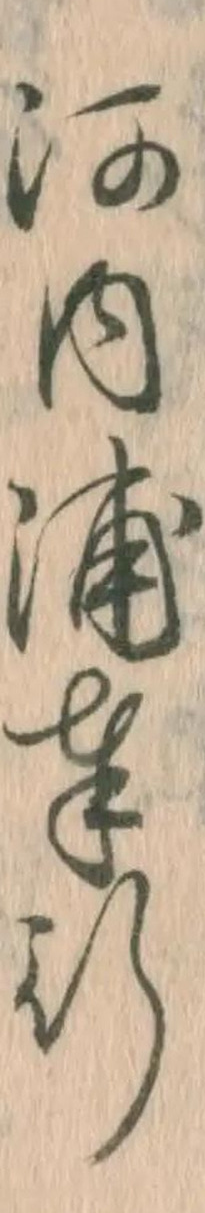河内浦奉行
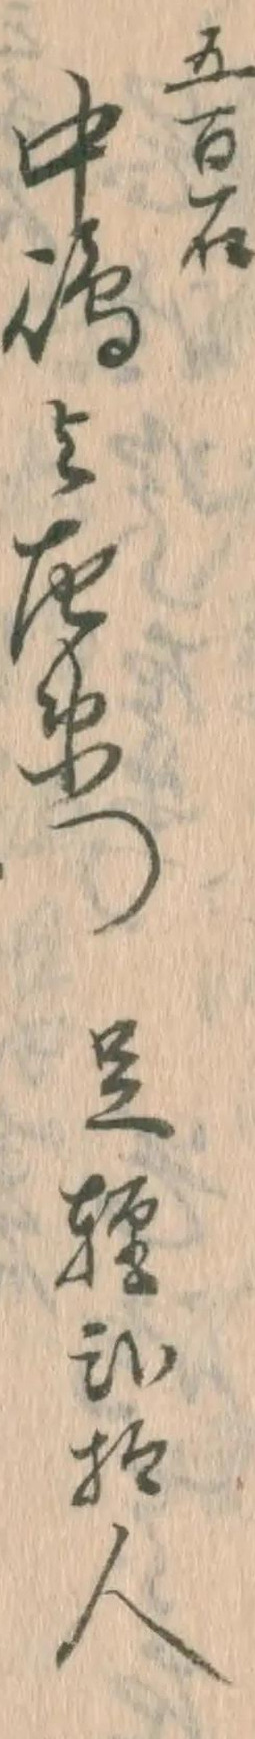中島与左衛門足軽弐拾人
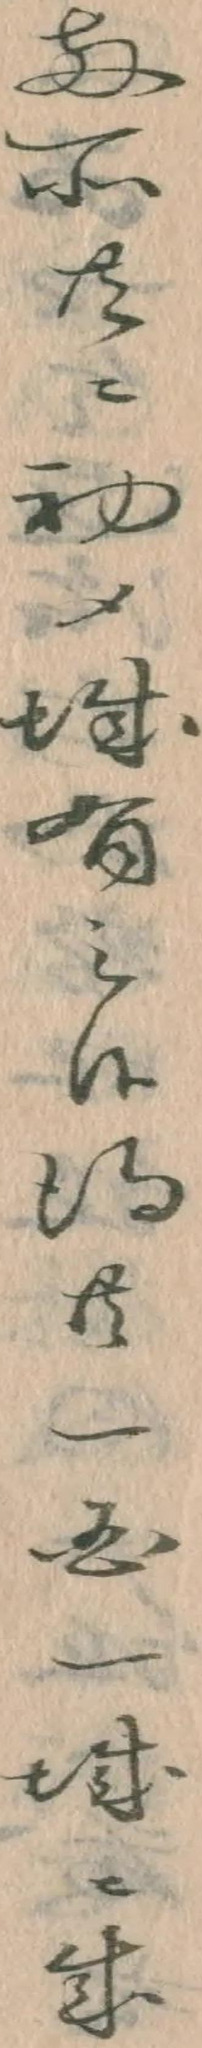両所共に初め城有之候得共一国一城に成
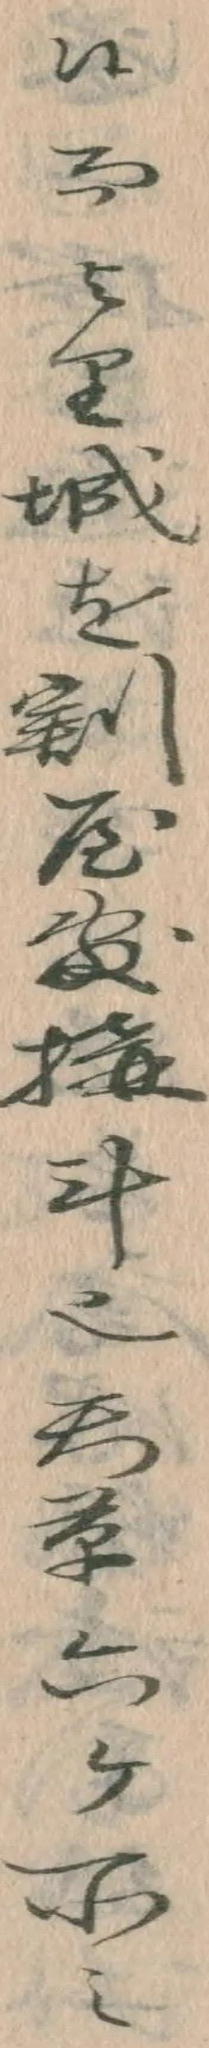候而与里城を割屋敷構斗也天草六け所之
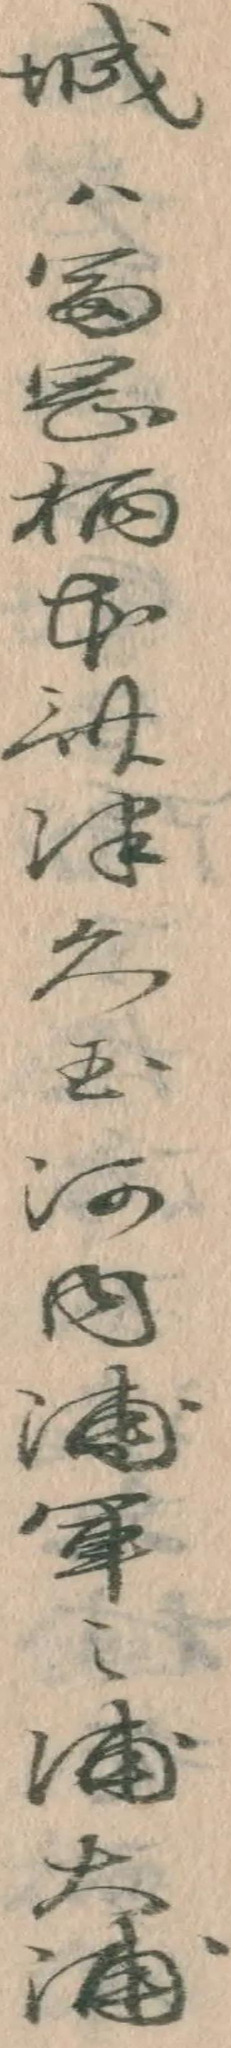城は冨岡栖本斎津久国河内浦軍之浦大浦
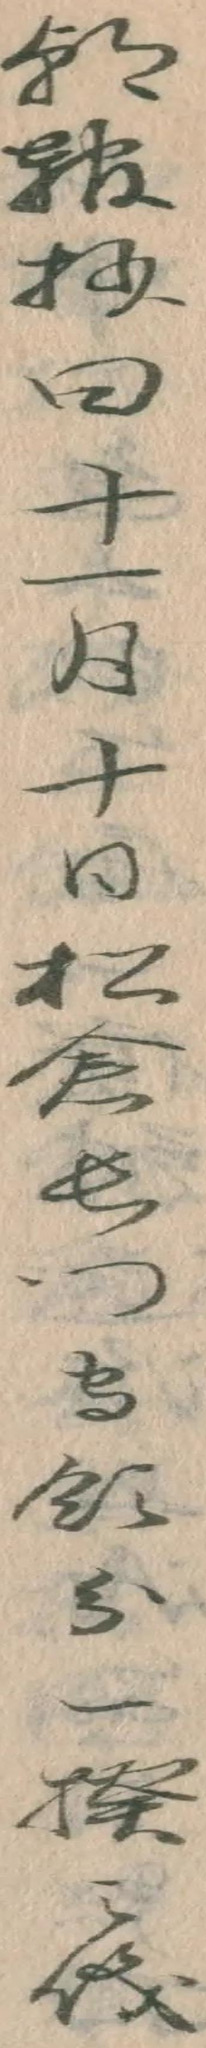朝報抄曰十一月十日松倉長門守領分一揆之儀
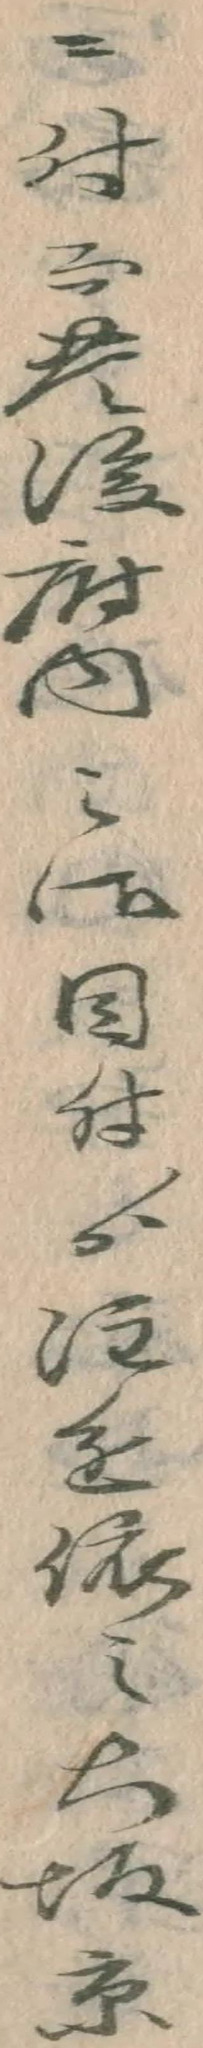に付而豊後府内之御目付ゟ注進依之大坂京
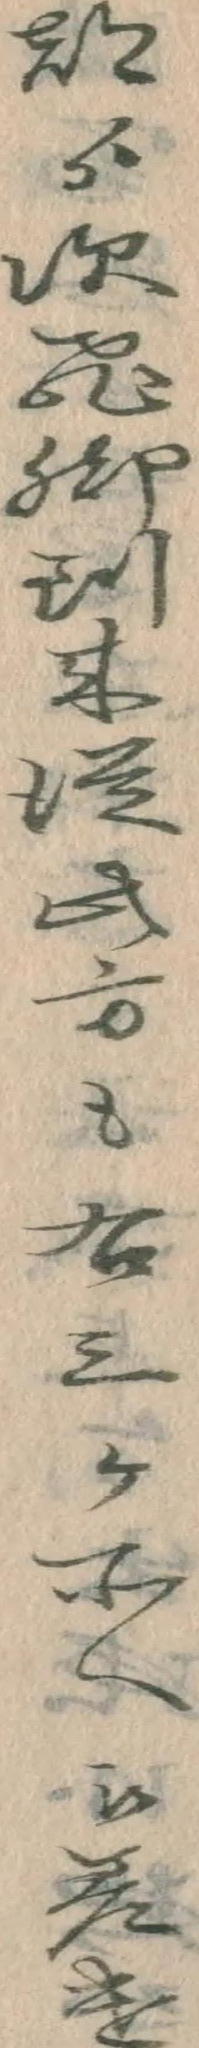都ゟ次飛脚到来従此方も右三け所へ被差遣
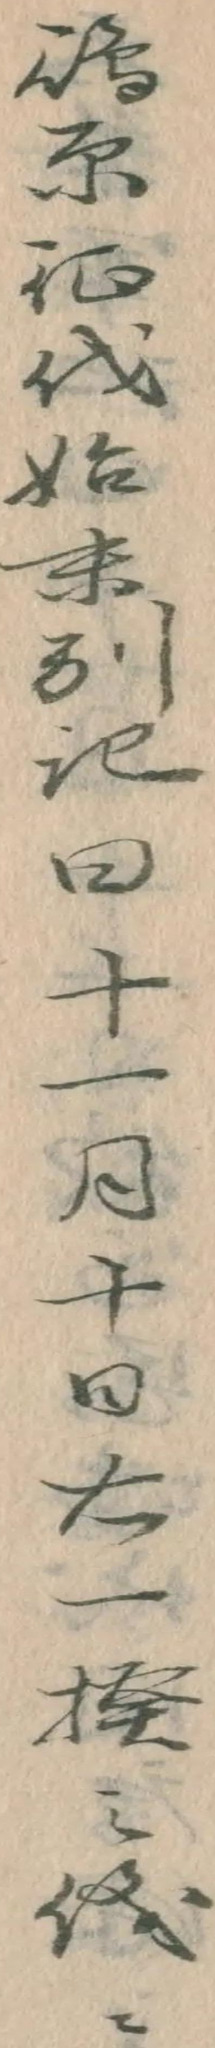島原征伐始末別記曰十一月十日右一揆之儀に
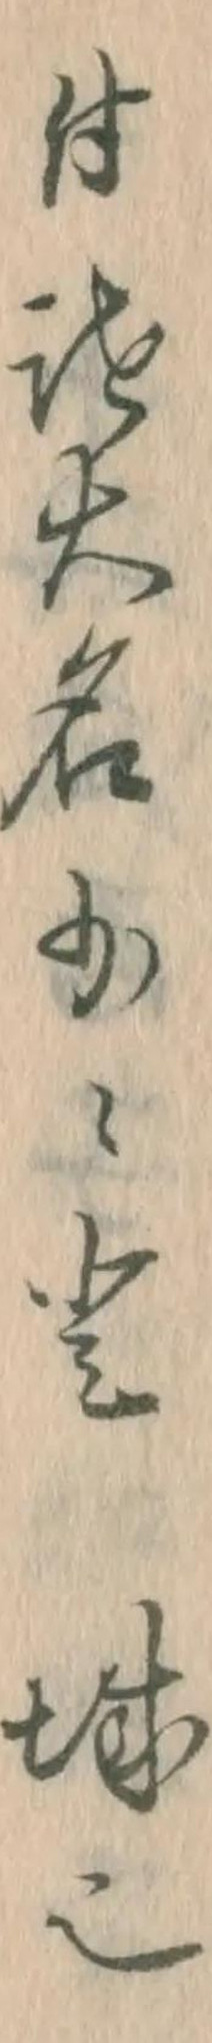付諸大名少に登城也

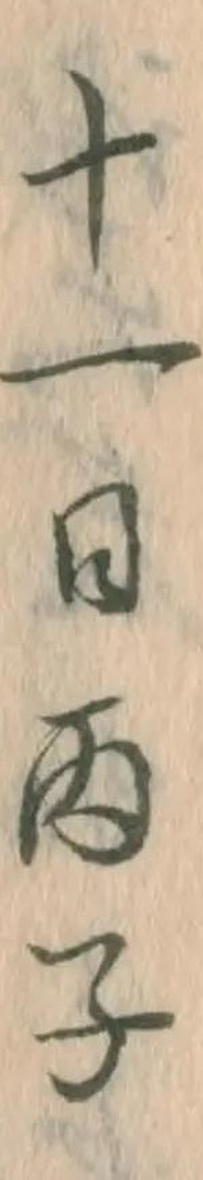十一月丙子
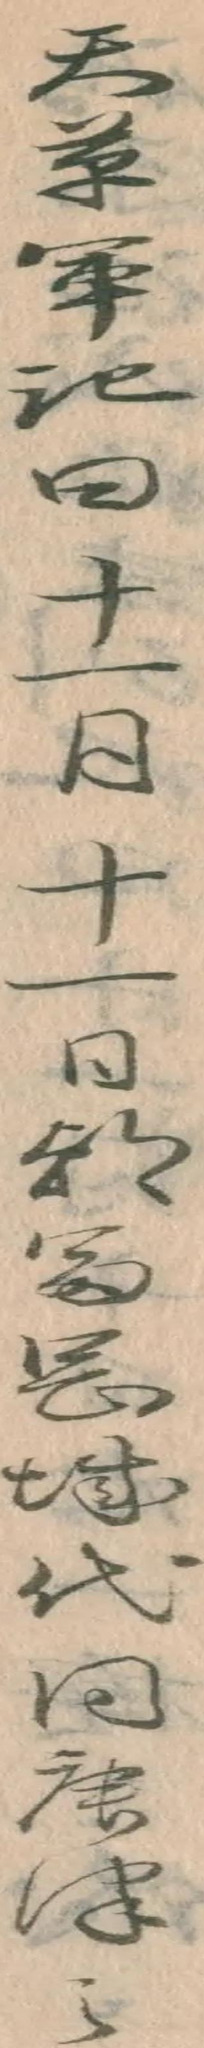天草軍記曰十一月十一日朝冨岡城代同唐津之
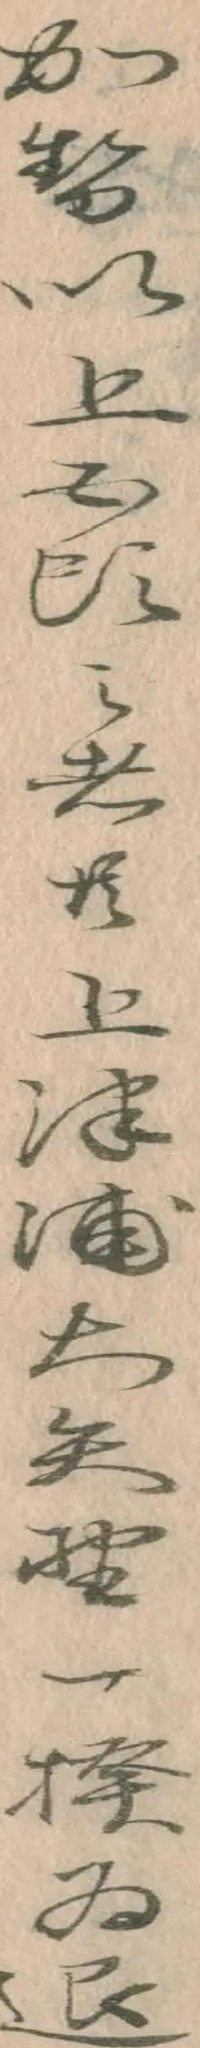加勢以上五頭之者共上津浦大矢野一揆ゐ退
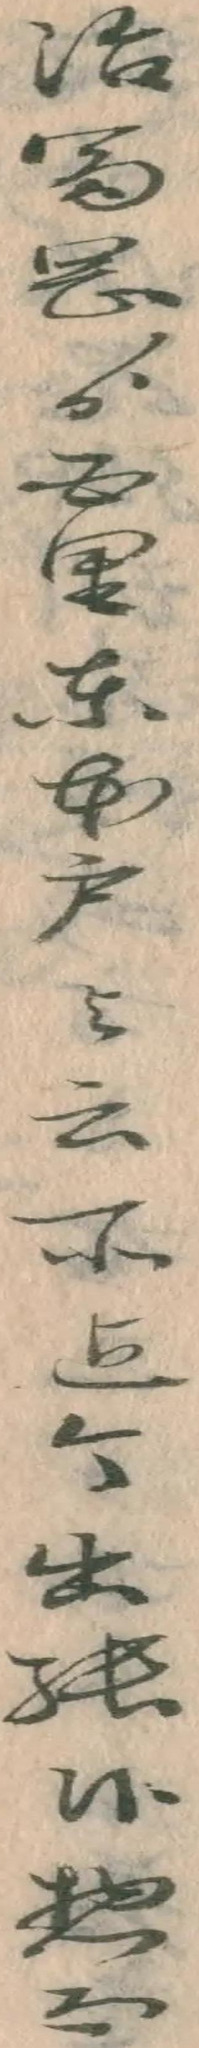治冨岡ゟ五里東本戸与云所迄令出張候惣而
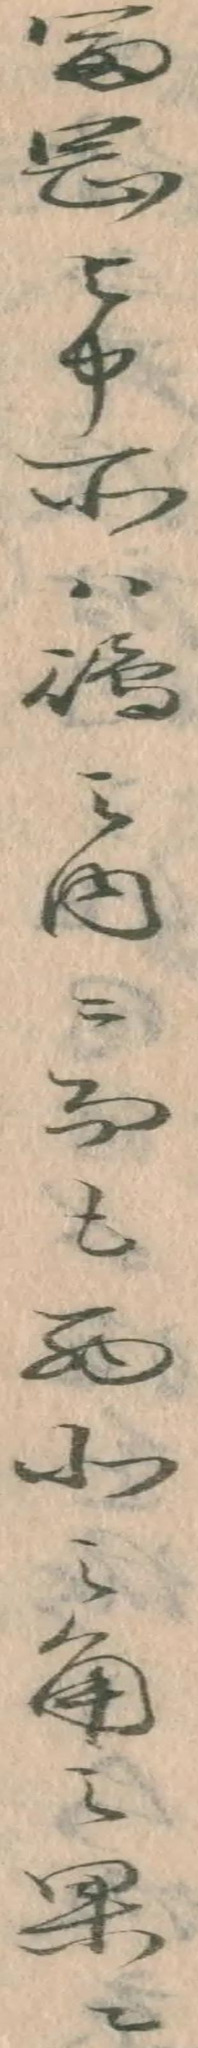冨岡と申所は島之内に而も西北之角之果に
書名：切支丹御退治記 49巻. [2]
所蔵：国立国会図書館 National Diet Library, JAPAN
